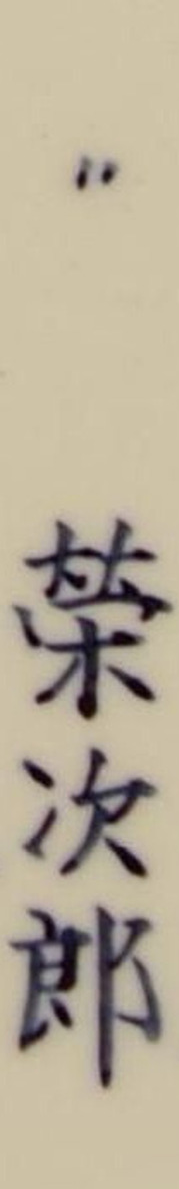榮次郎
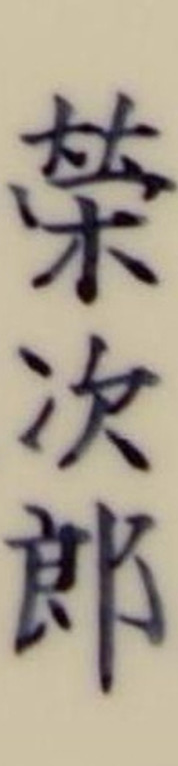榮次郎
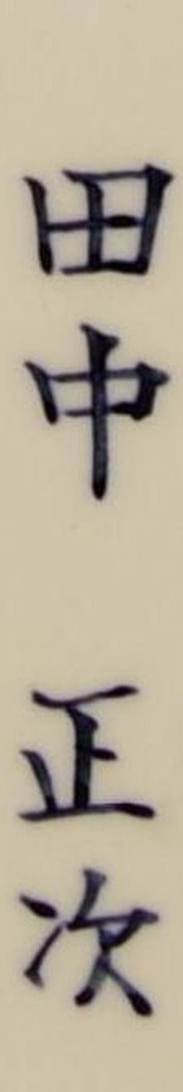田中正次
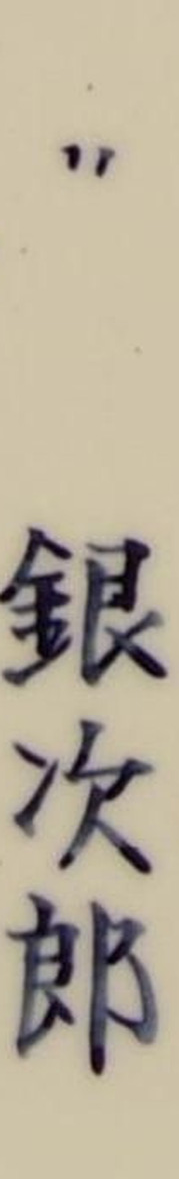銀次郎
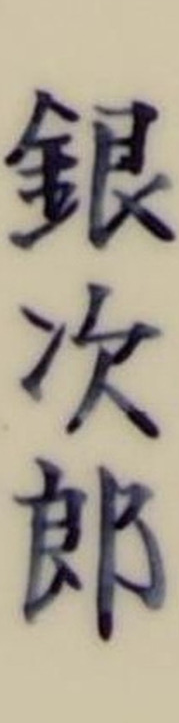銀次郎
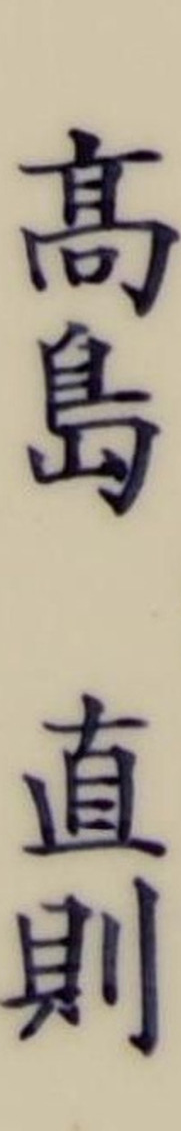高島直則
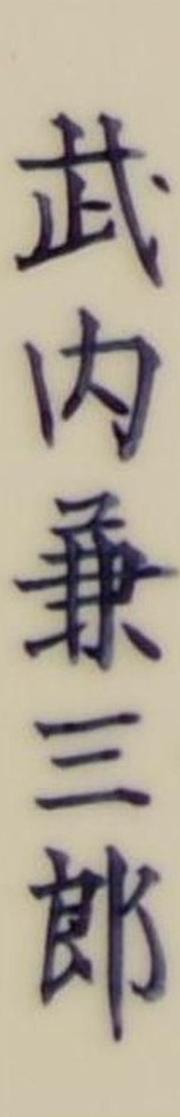武内兼三郎

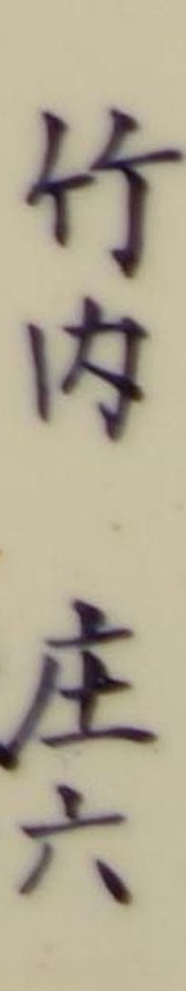竹内庄六
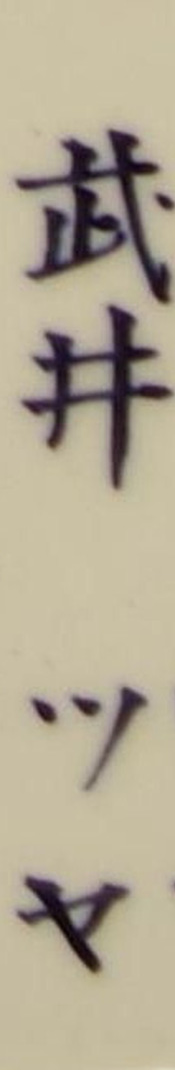武井ツヤ
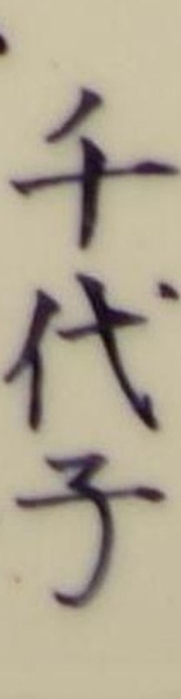千代子
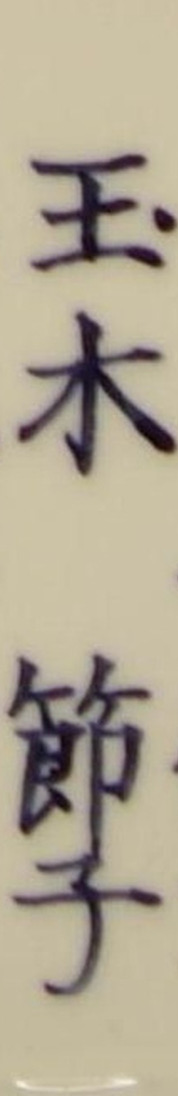玉木節子
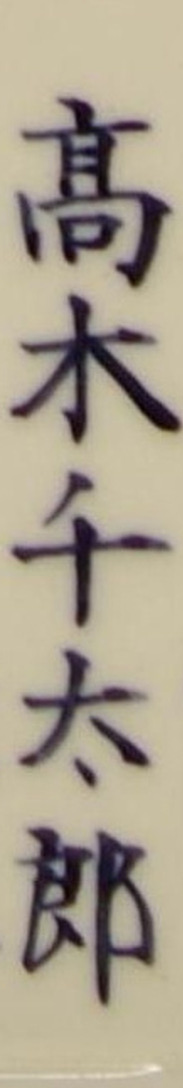高木千太郎
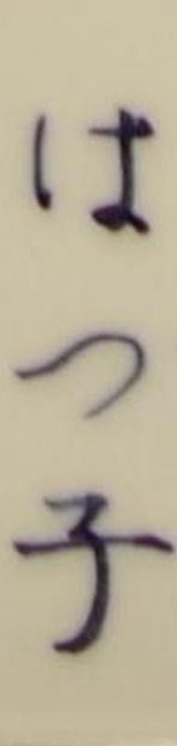はつ子
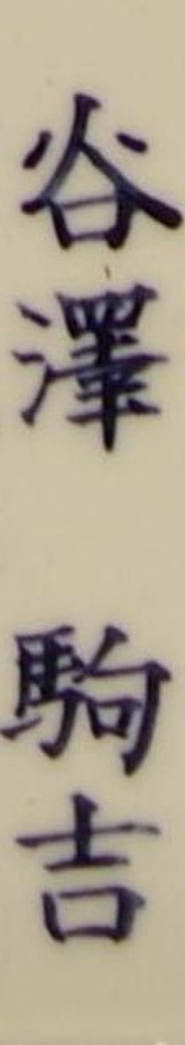谷澤駒吉
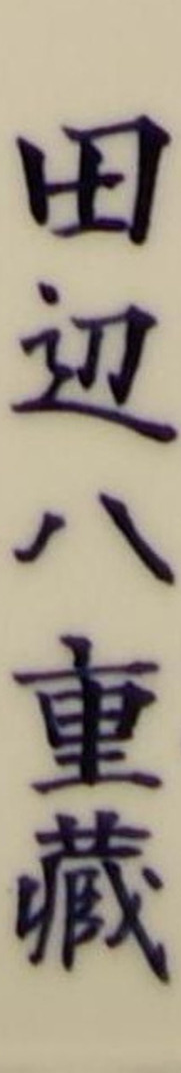田辺八重蔵
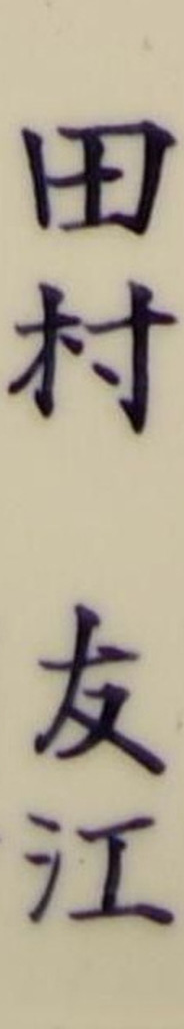田村友江
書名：E~L
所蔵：高野山金剛峯寺
